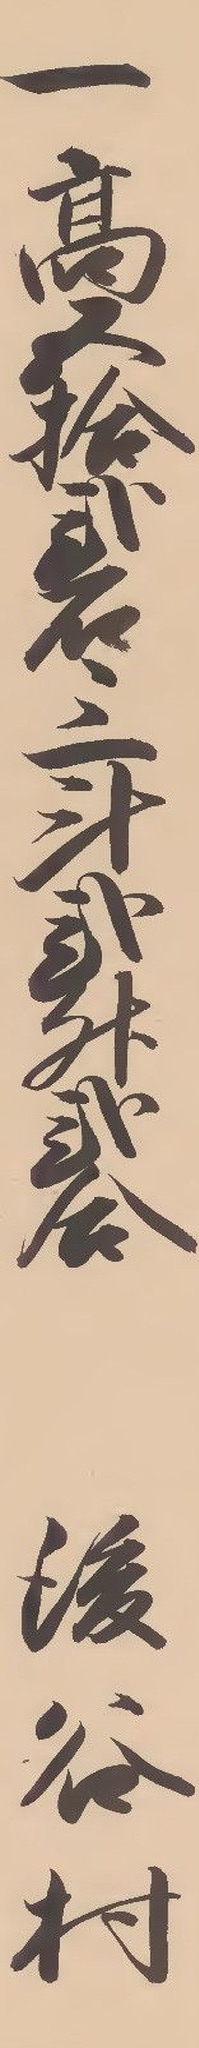一高五拾弐石三斗弐升弐合後谷村
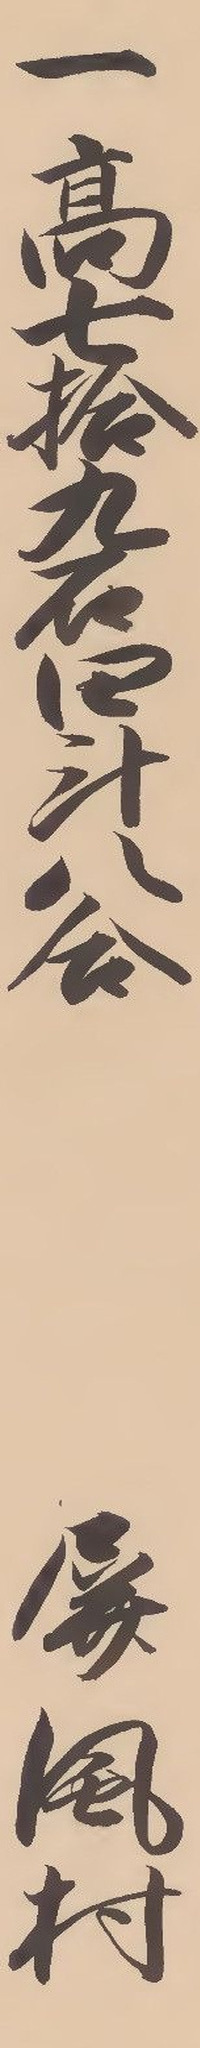一高七拾九石四斗八合屏風村
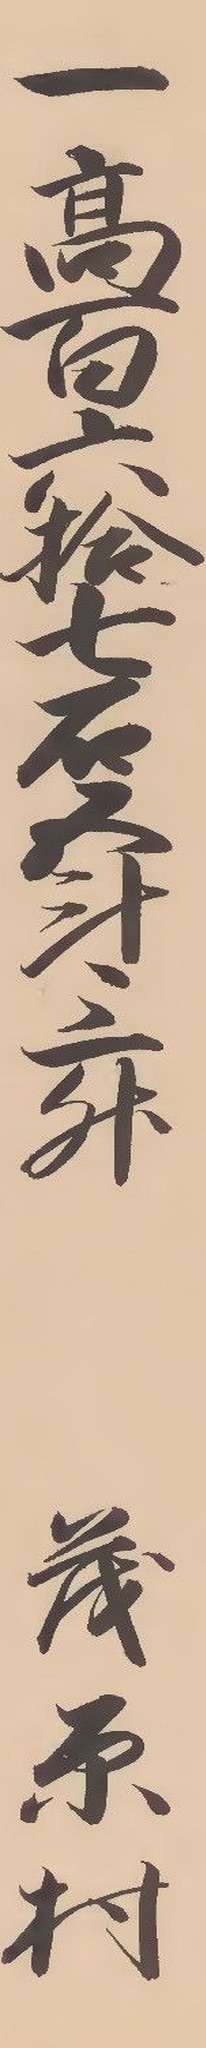一高百六拾七石五斗三升茂原村
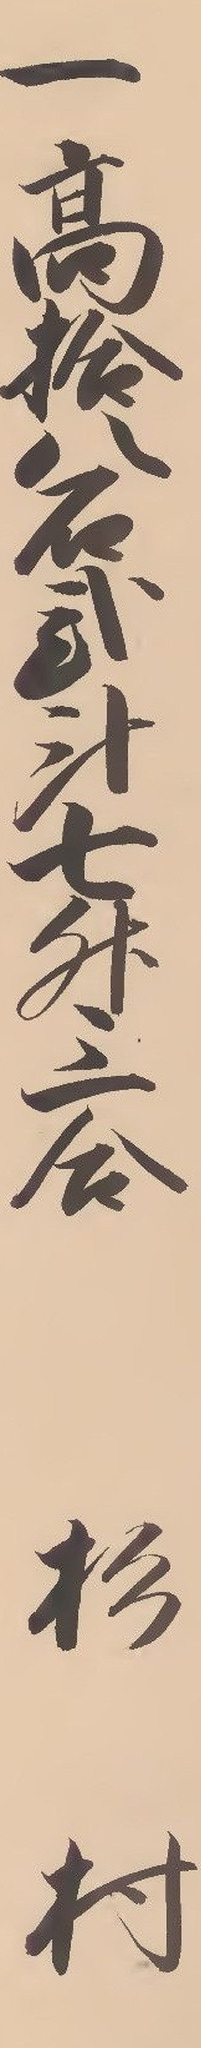一高拾八石弐斗七升三合杉村
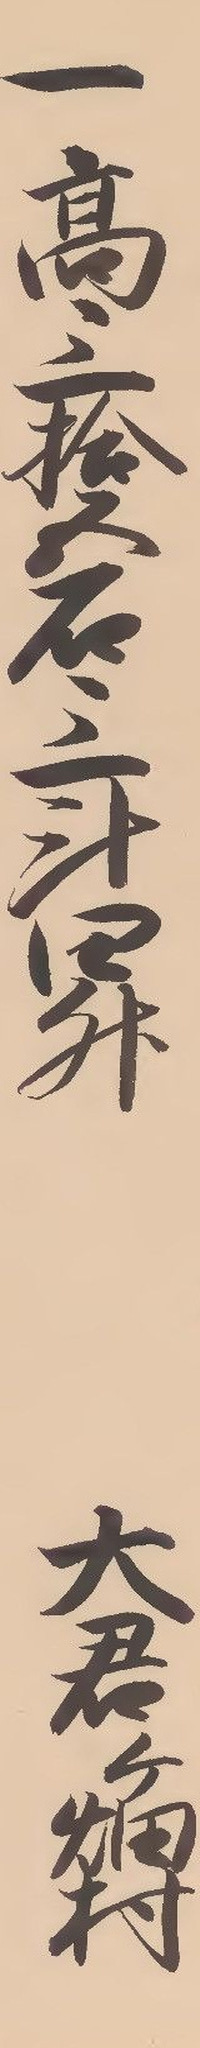一高三拾五石三斗四升大君ヶ畑村
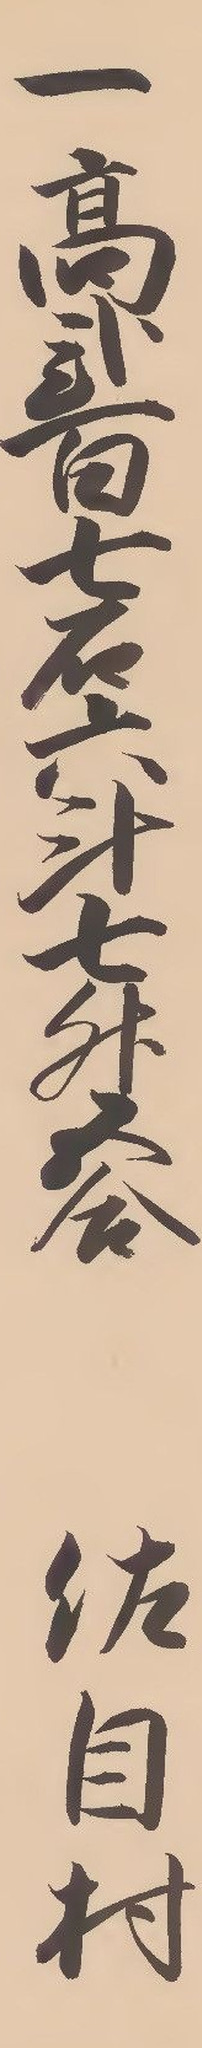一高弐百七石六斗七升五合佐目村
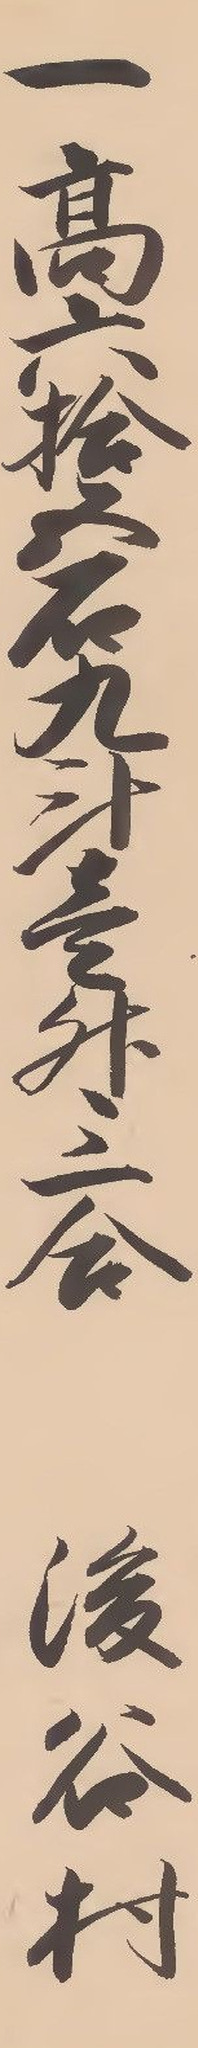一高六拾五石九斗壱升三合後谷村

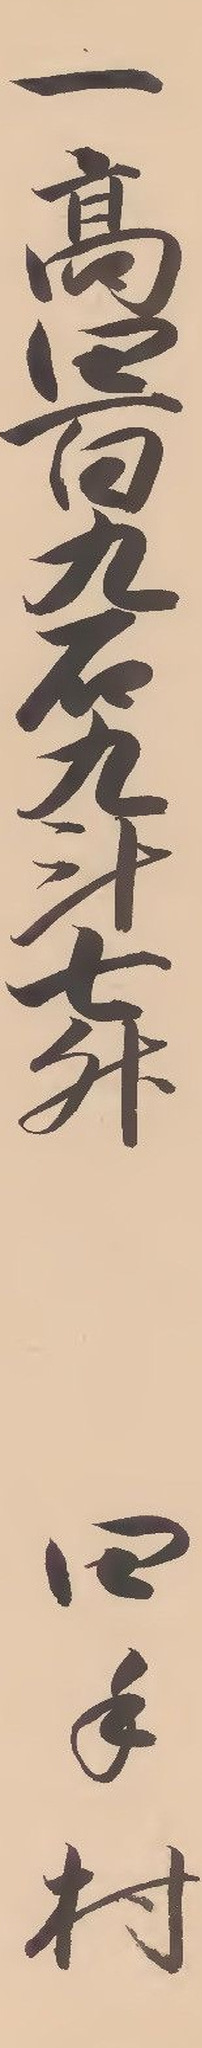一高四百九石九斗七升四手村
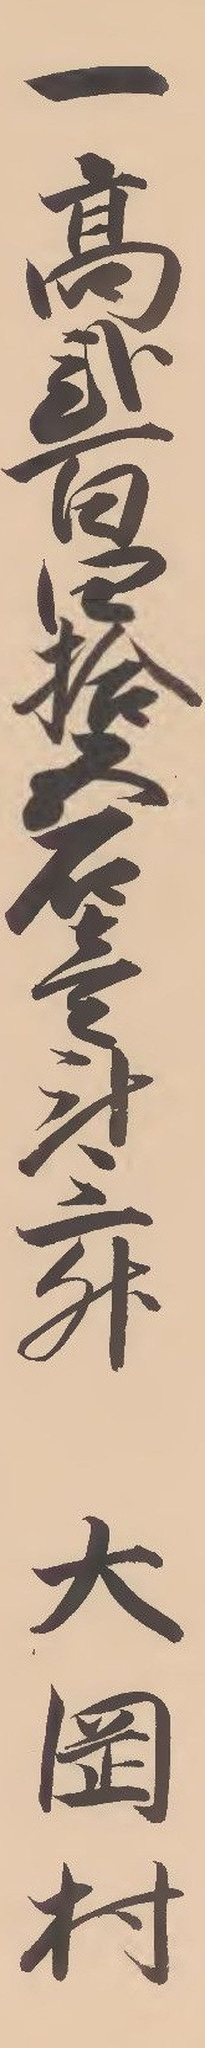一高弐百四拾五石壱斗三升大岡村
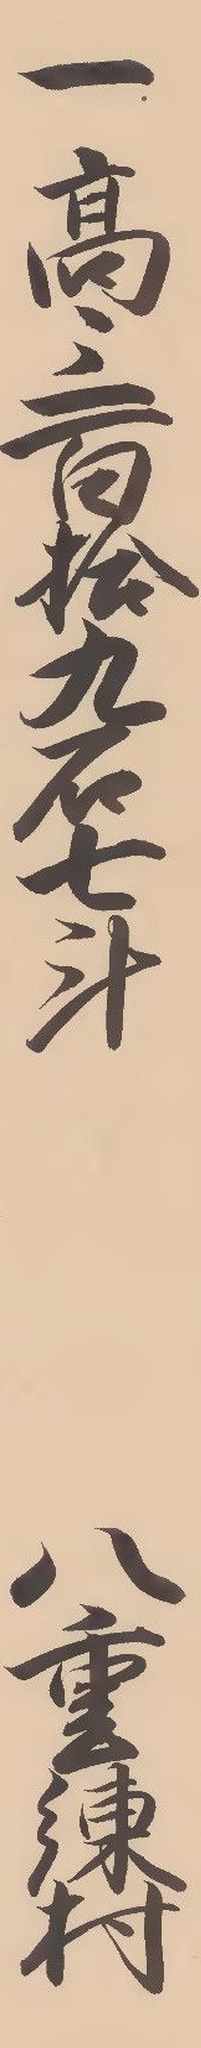一高三百拾九石七斗八重練村
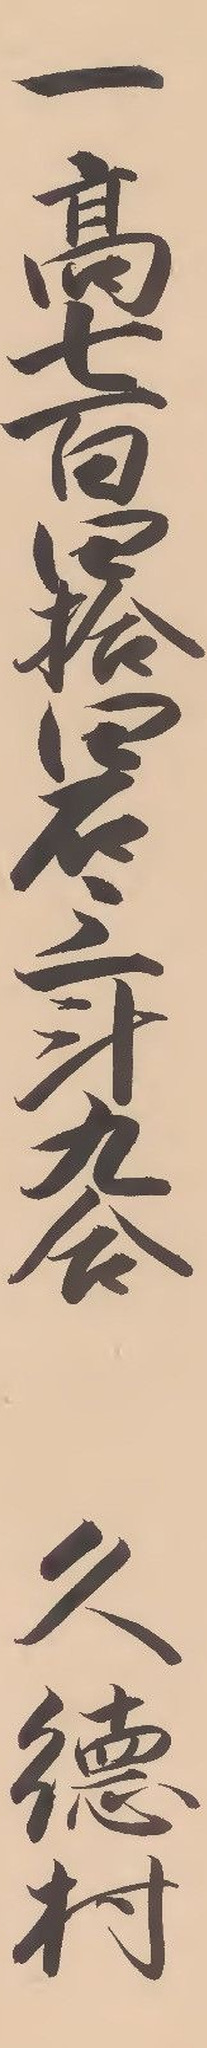一高七百四拾四石三斗九合久徳村
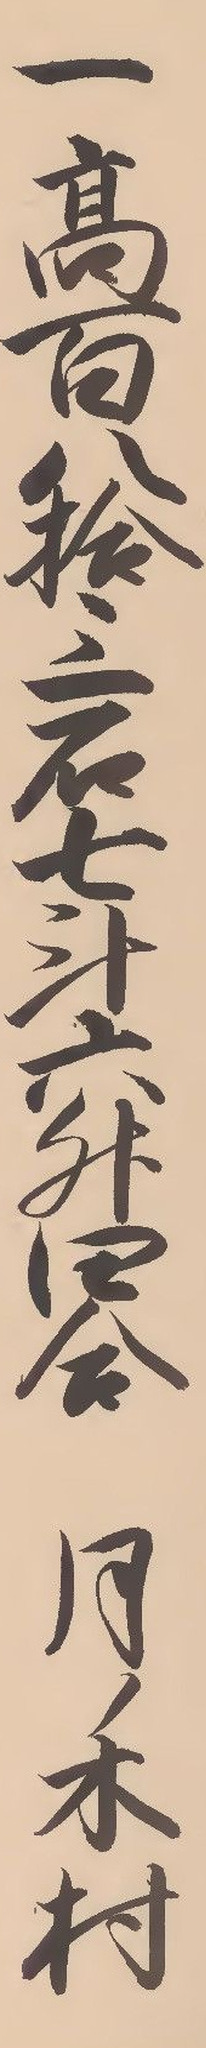一高百八拾三石七斗六升四合月ノ木村
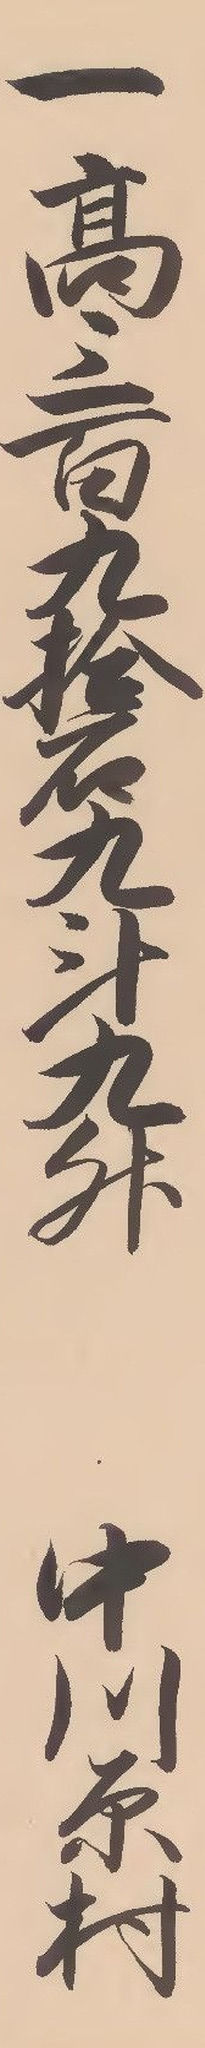一高三百九拾石九斗九升中川原村
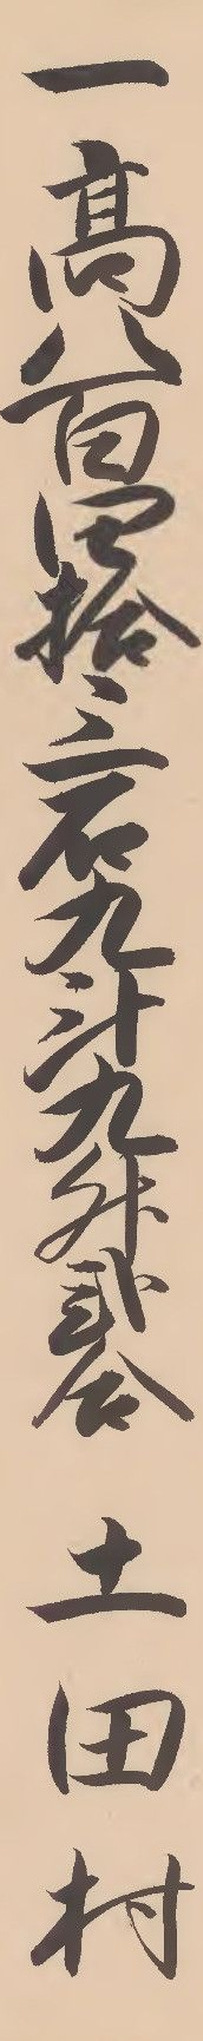一高八百四拾三石九斗九升弐合土田村
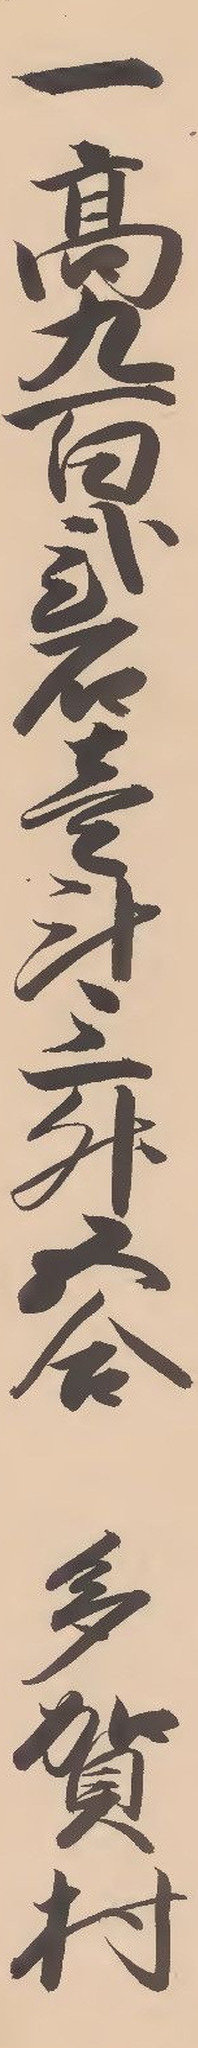一高九百弐石壱斗三升五合多賀村

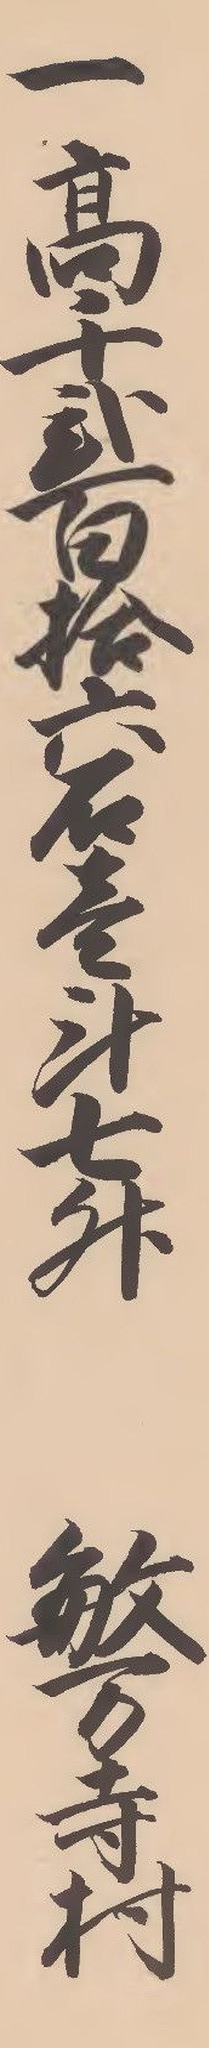一高千弐百拾六石壱斗七升敏万寺村
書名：近江国郷帳
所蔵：国立公文書館 National Archives of Japan
